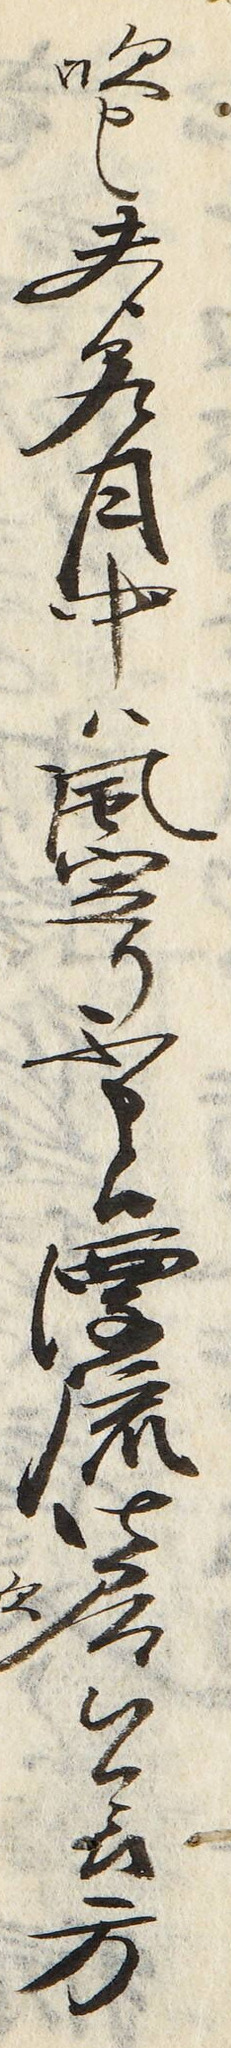吹申候夫ゟ九月中は風定り不申候漂流仕居候に付方
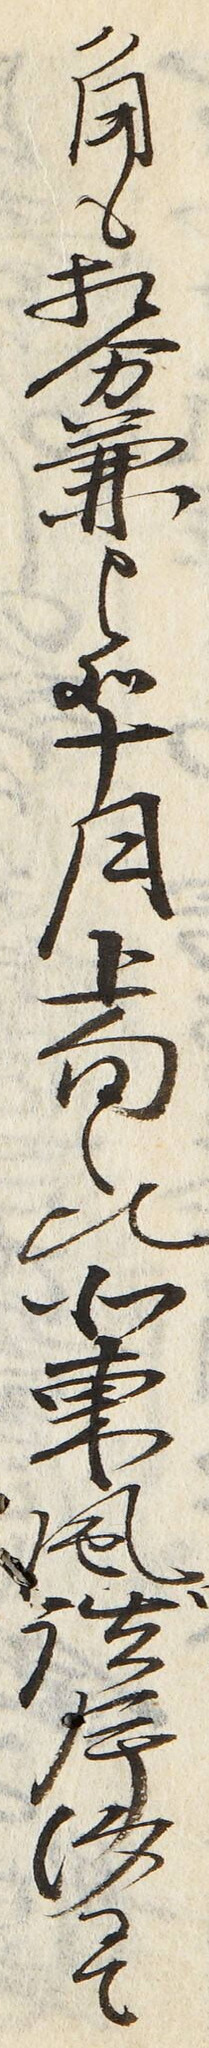角も相分兼申候処十月上旬之頃北東風吹詰岸？汐にて
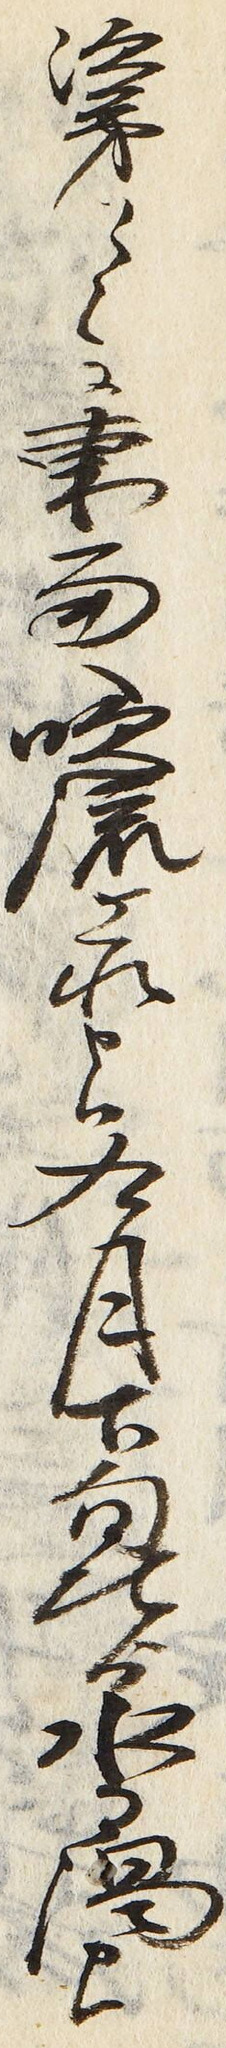次第々々に東南へ吹流され申候九月下句頃ゟ水に渇申候
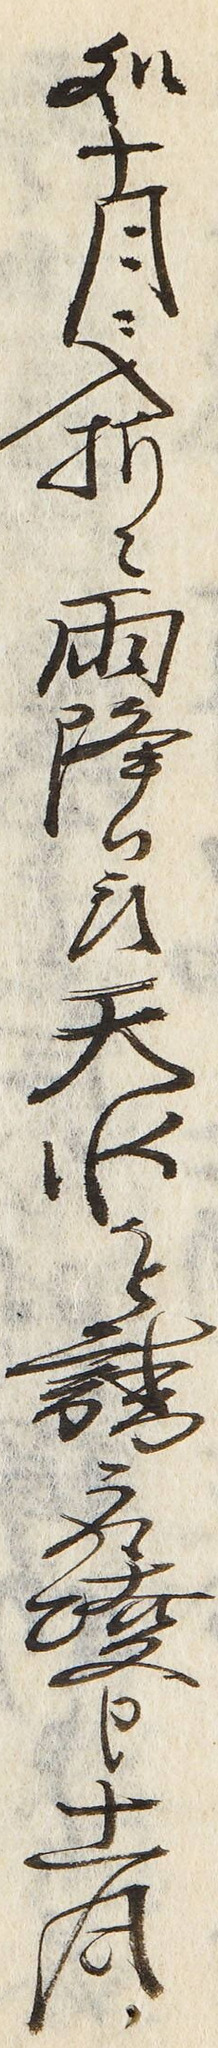処十月に入折々雨降候に付天水を請取凌申候十一月
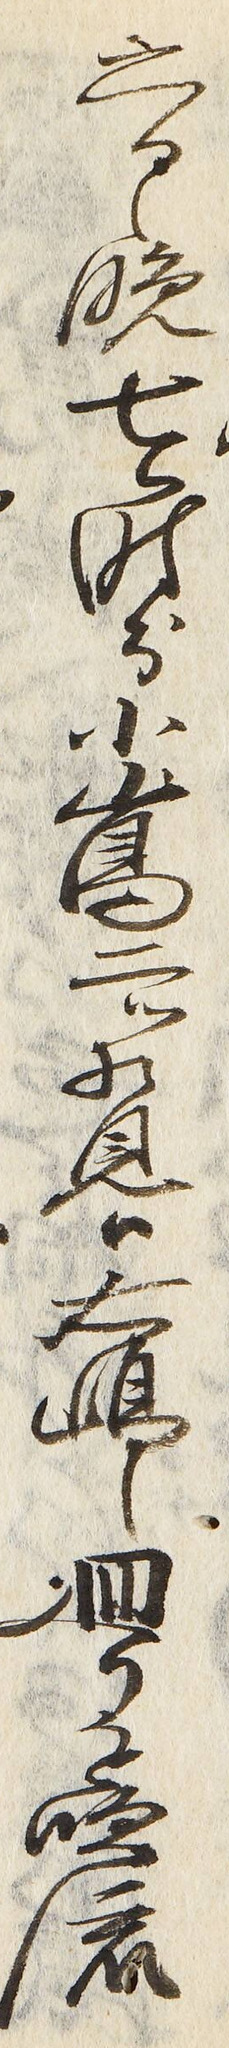六日之晩七つ時分小島二つ相見候右島之廻りを吹流
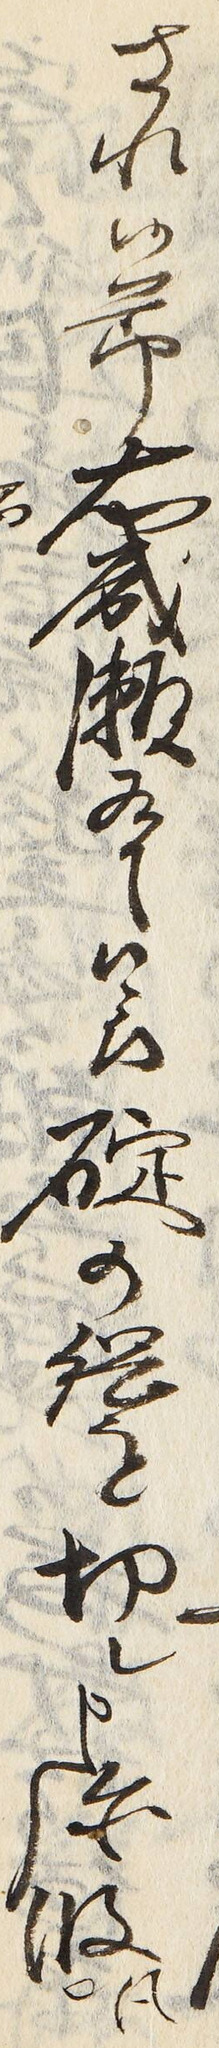され候節右石成瀬有之候に付碇の綱を切レ申弥波風
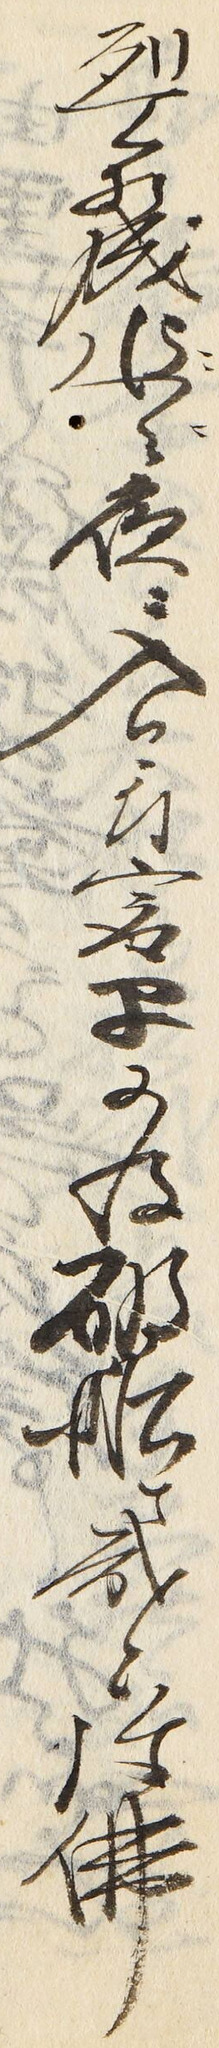烈く相成追々夜に入候に付最早可及破船に哉と弥仏
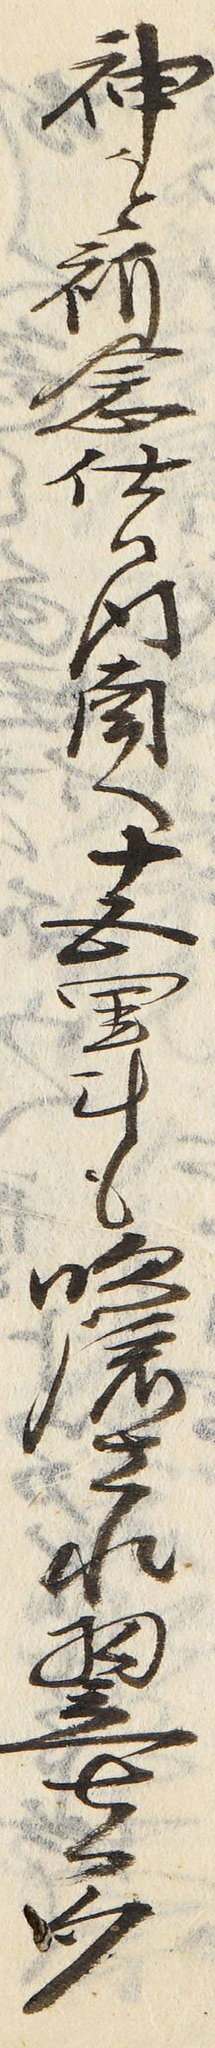神を祈念仕候内南へ十五里斗も吹流され翌七日夕
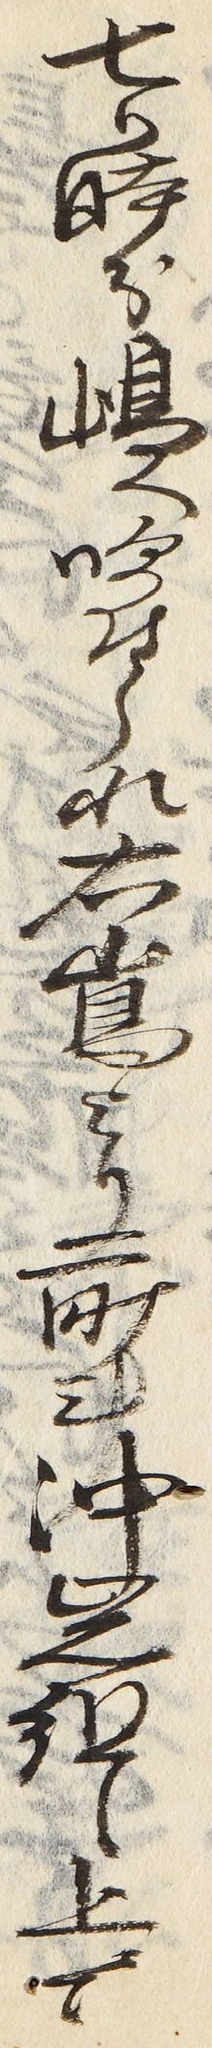七つ時分島へ吹付られ右島より二町斗沖岩組之上にて
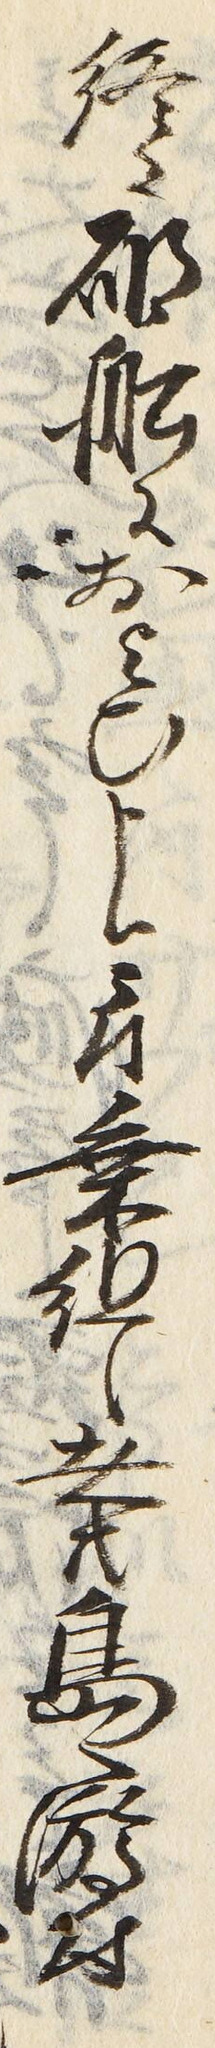終に破船におよひ申候に付乗組之者共島へ游付申候
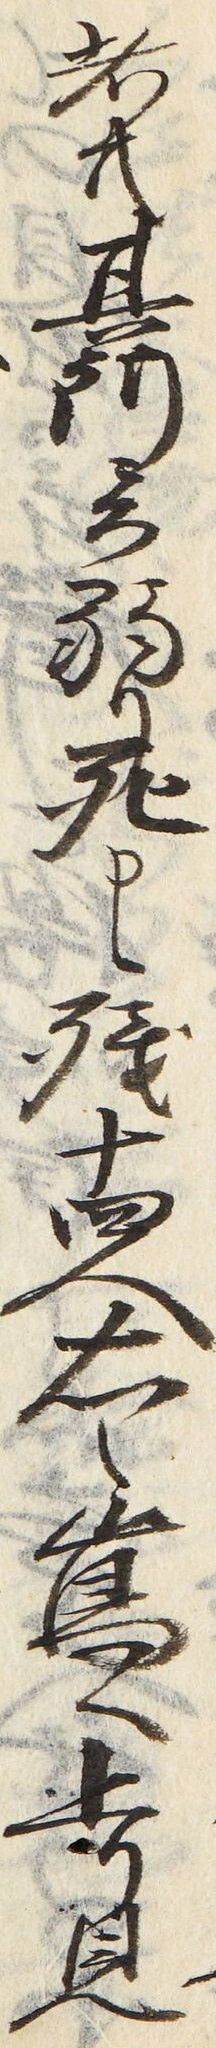者共其所にて弱り死申候残十四人右之島へ上り見
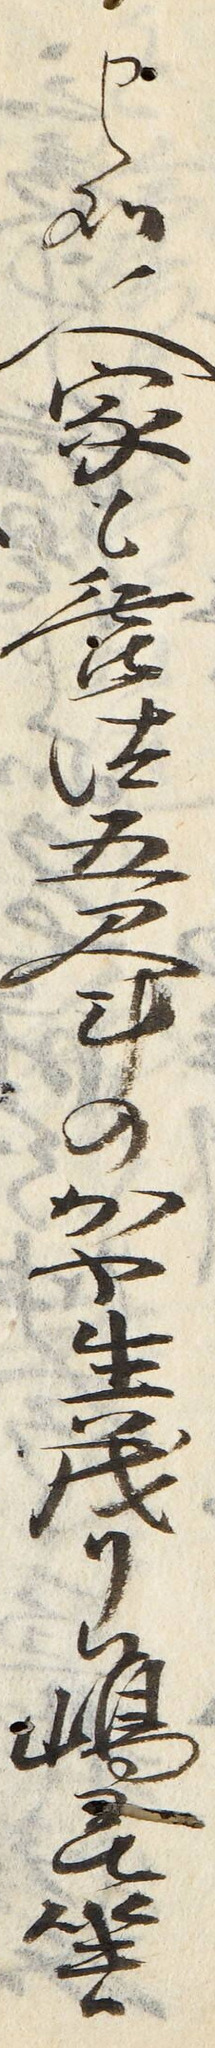申候処人家も無御座五尺斗のかや生茂り候島に御坐候
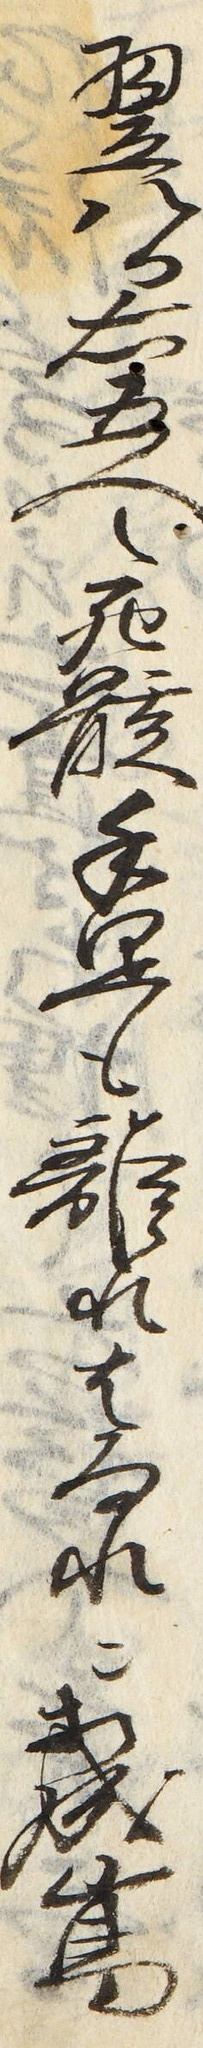翌八日右五人の死骸手足も離れはなれに相成島

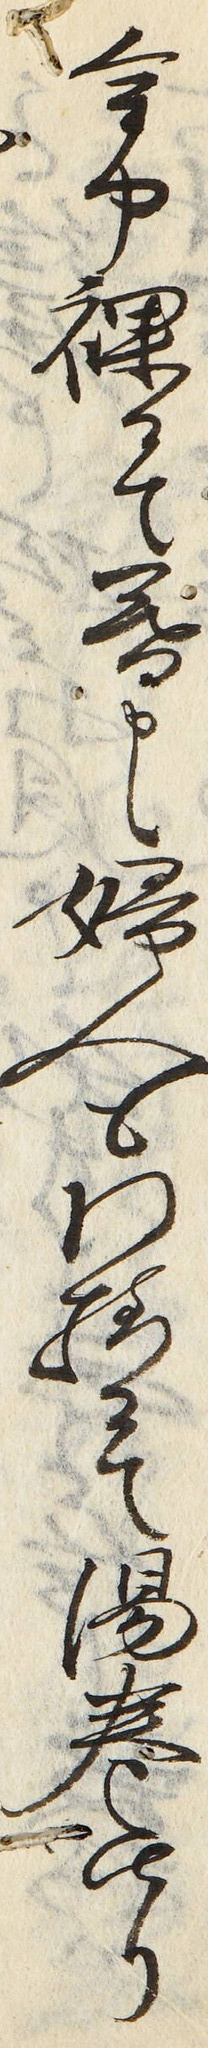年中裸にて暮申候婦人も同様にて湯巻仕り
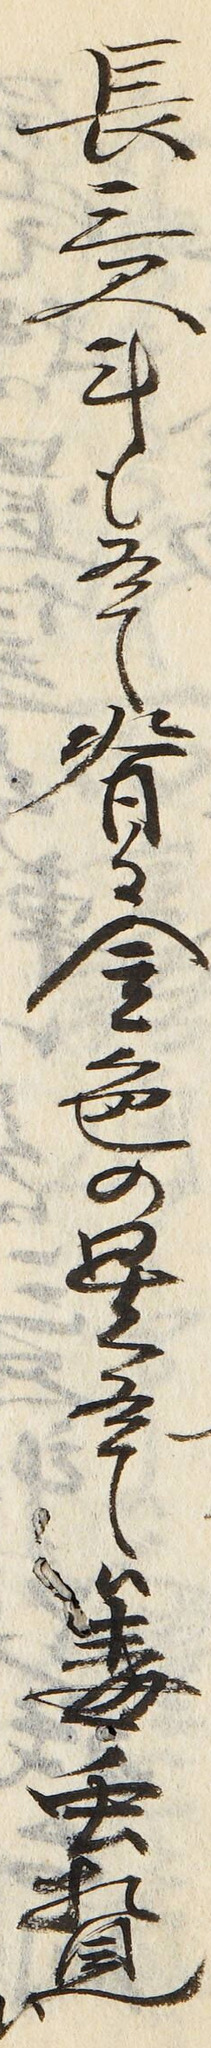長三尺斗も有之背に金色の星有之候毒虫相見候
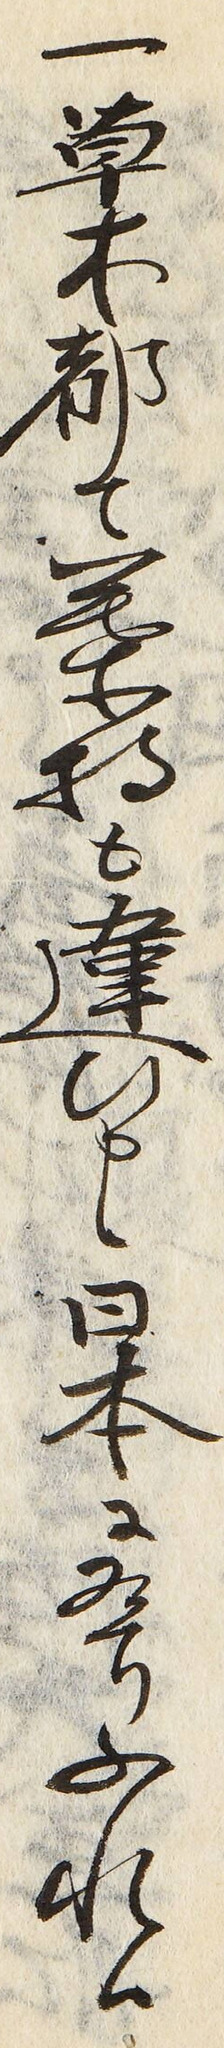一草木都て葉持も違ひ申候日本に有りふれ候
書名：漂流記
